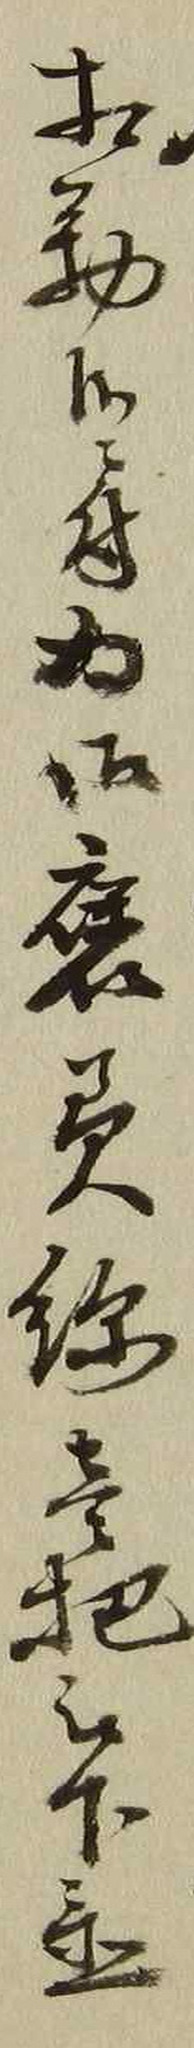相勤候ニ付為御褒美綿壱把被下置
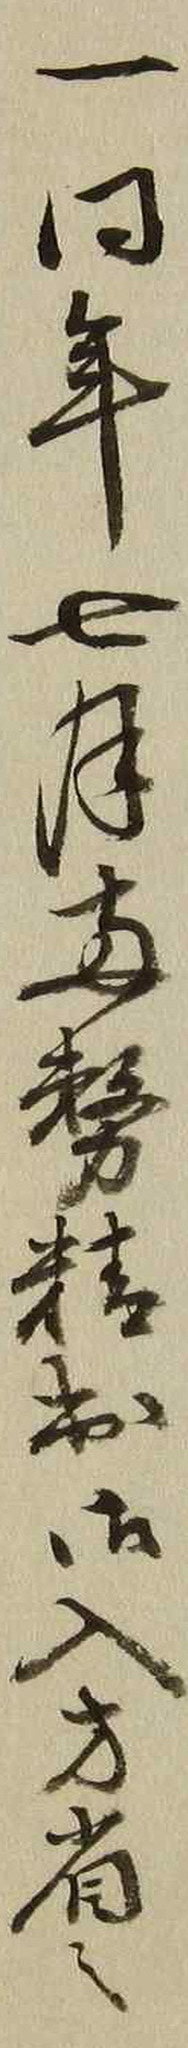一同年七月両務精出御入方省之
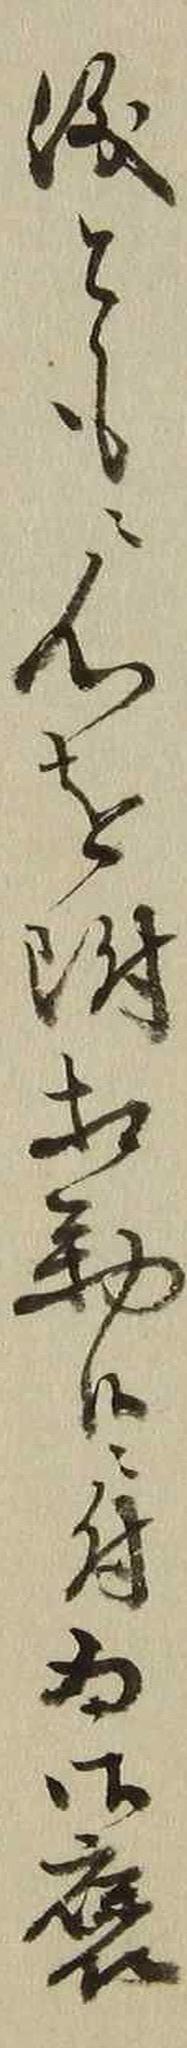儀ともニ心を附相勤候ニ付為御褒
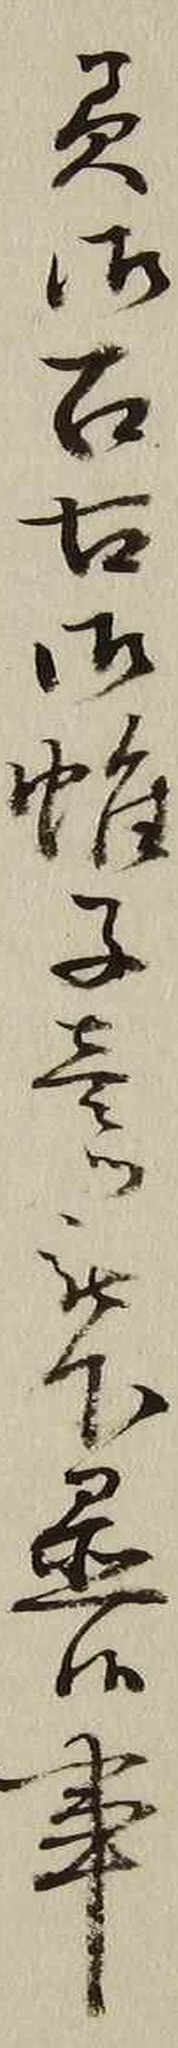美御召古御帷子壱ツ被下置候事
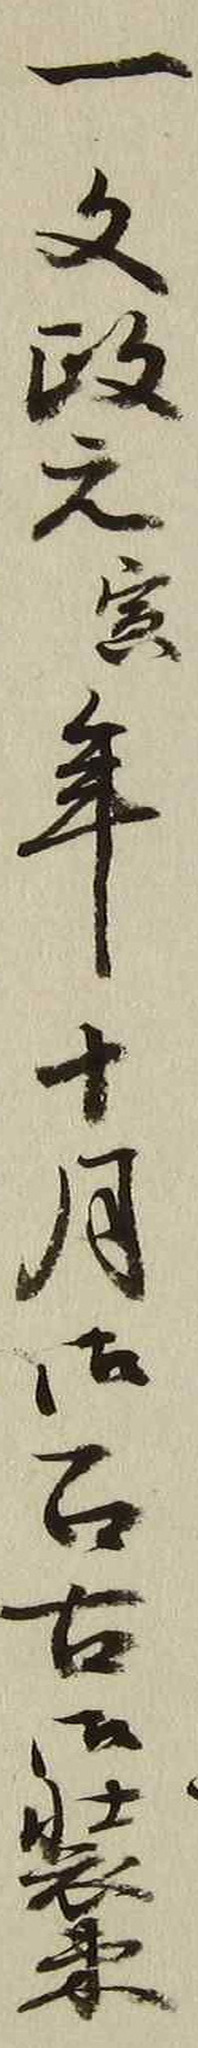一文政元寅年十月御召古御装束
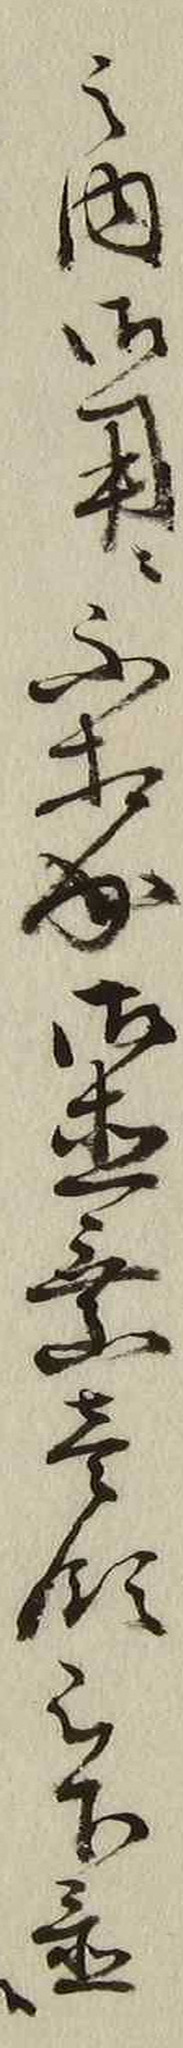之内御用ニ不相成御直垂壱領被下置候
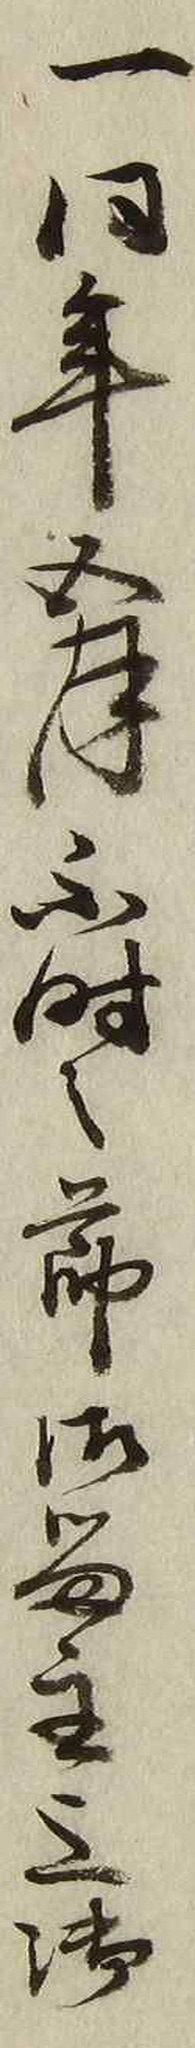一同年五月不時之節御留学主上御
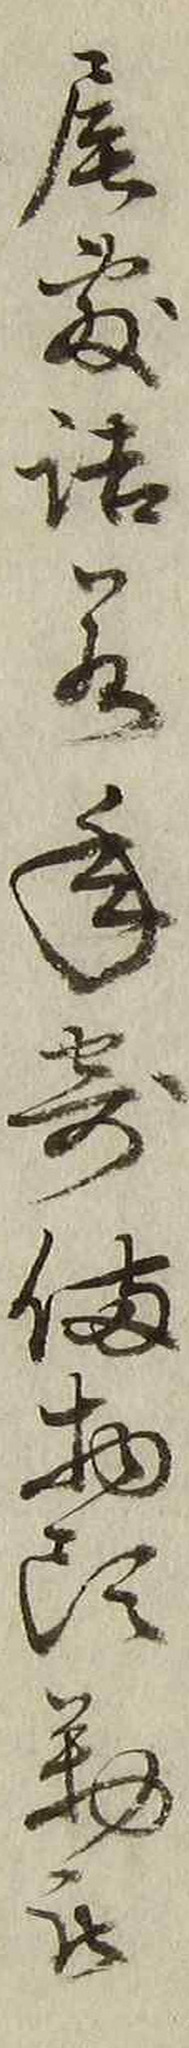尾敷詰若年寄備物頭勤被
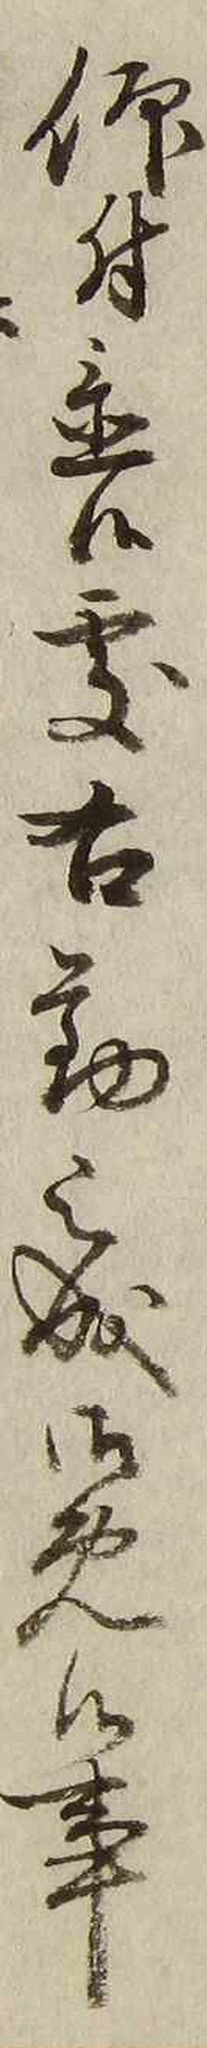仰付置候処右勤被成御免候事
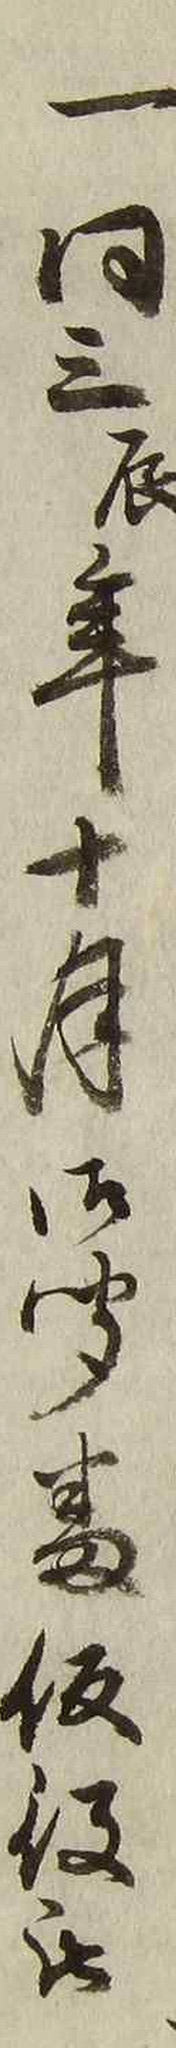一同三辰年十月御聞番仮役被
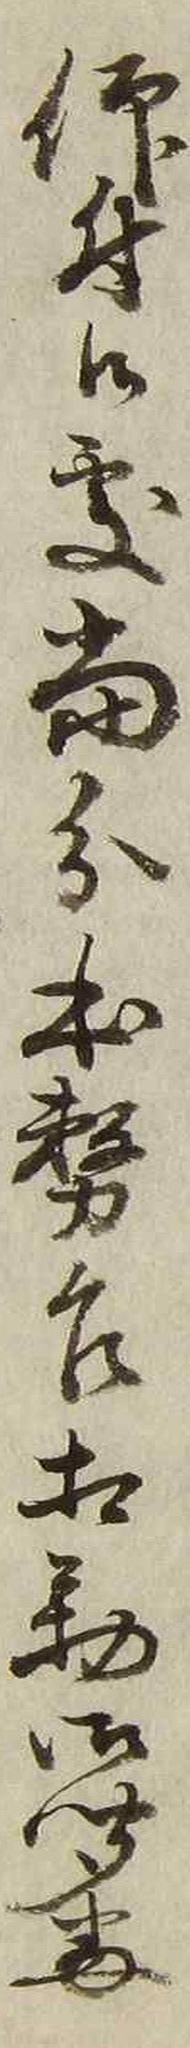仰付候処当分本務乍相勤御聞番
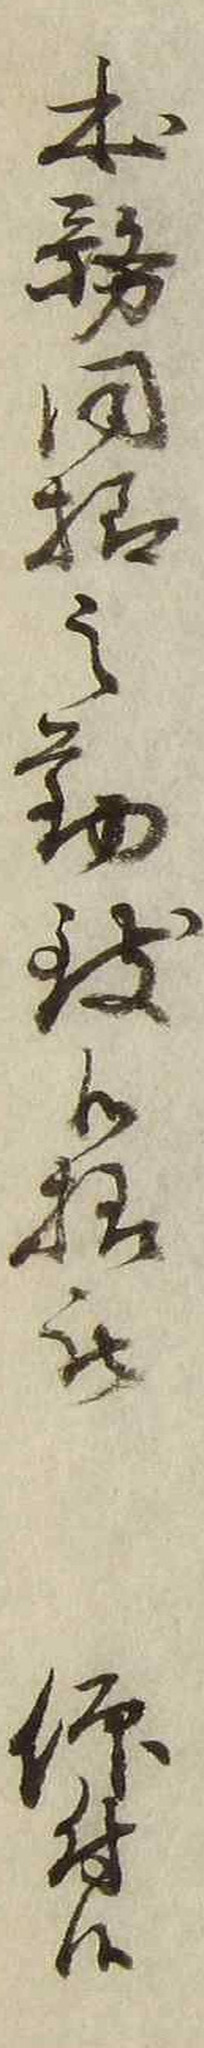本務同様之勤致候様被仰付候

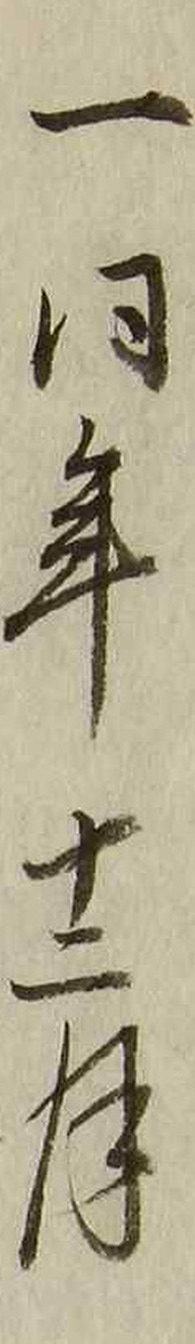一同年十二月
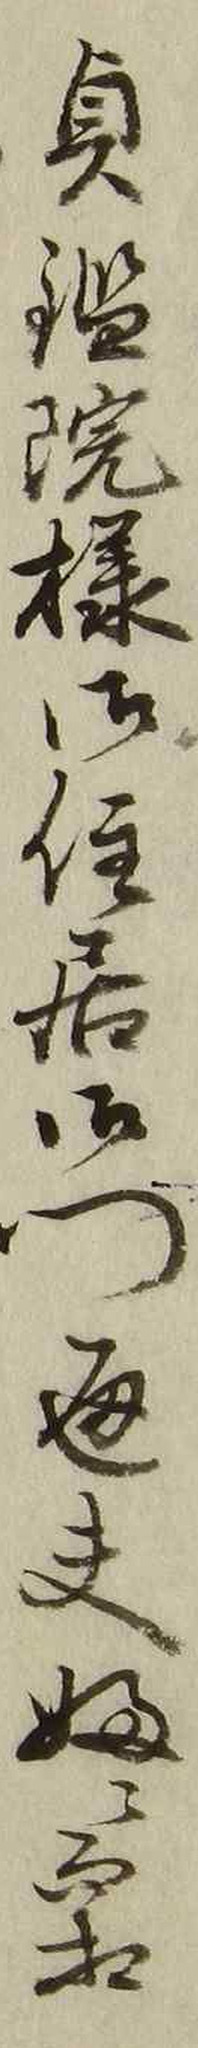貞鑑院様御住居御門通夫婦ニ而相
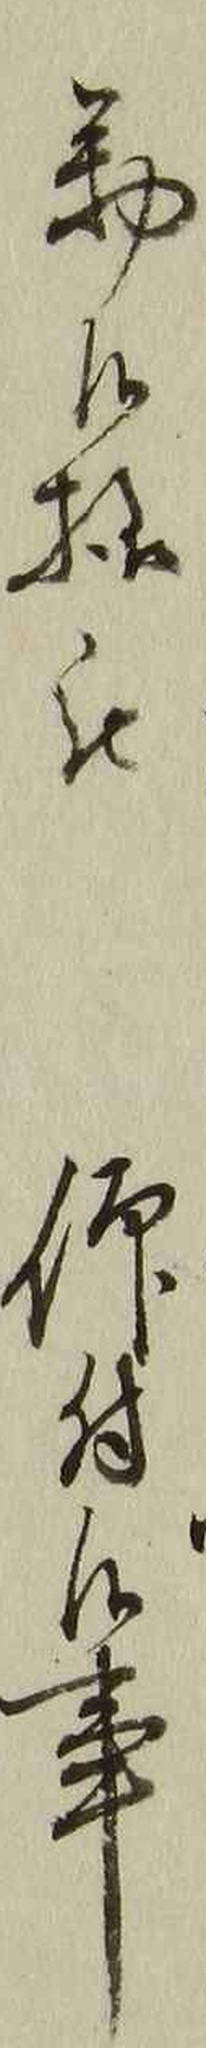勤候様被仰付候事
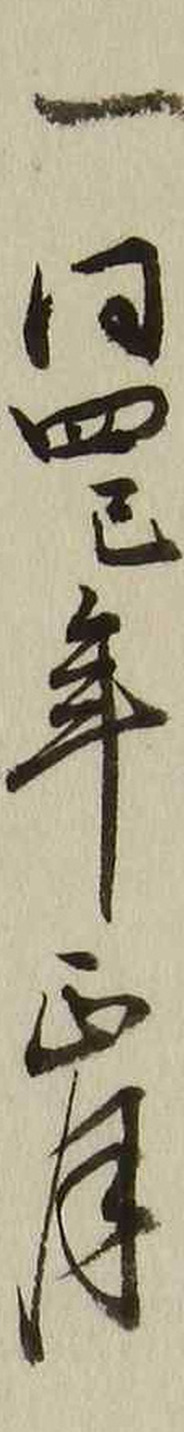一同四巳年正月
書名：諸士系譜　巻之35　は之部3
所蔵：会津若松市立会津図書館
